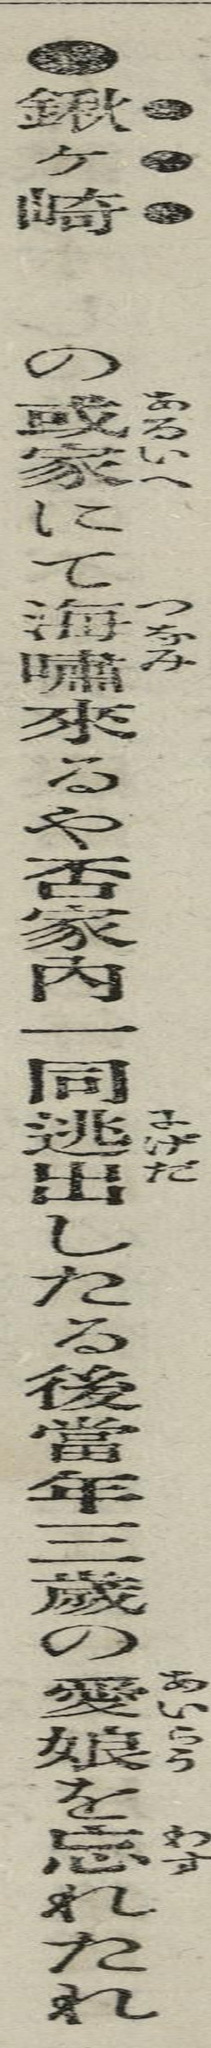●鍬ケ崎の或家にて海嘯来るや否家内一同逃出したる後当年三歳の愛娘を忘れたれ
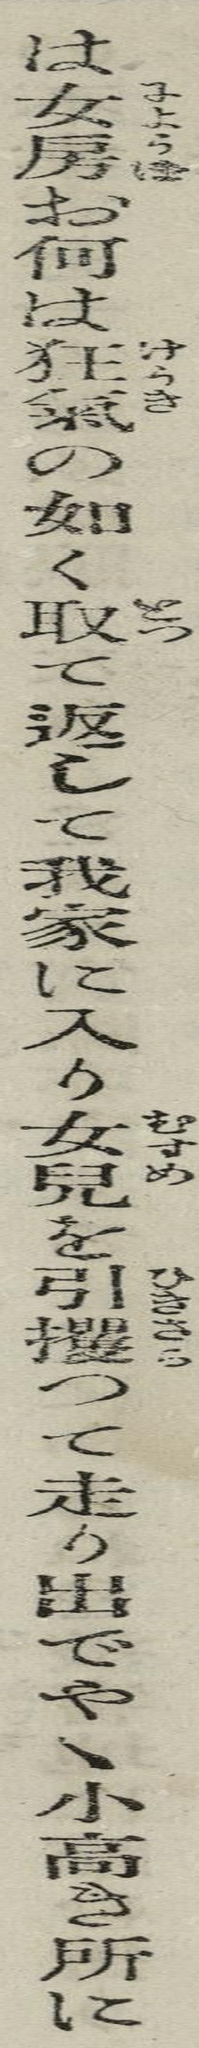は女房お何は狂気の如く取て返して我家に入り女児を引攫つて走り出でやヽ小高き所に
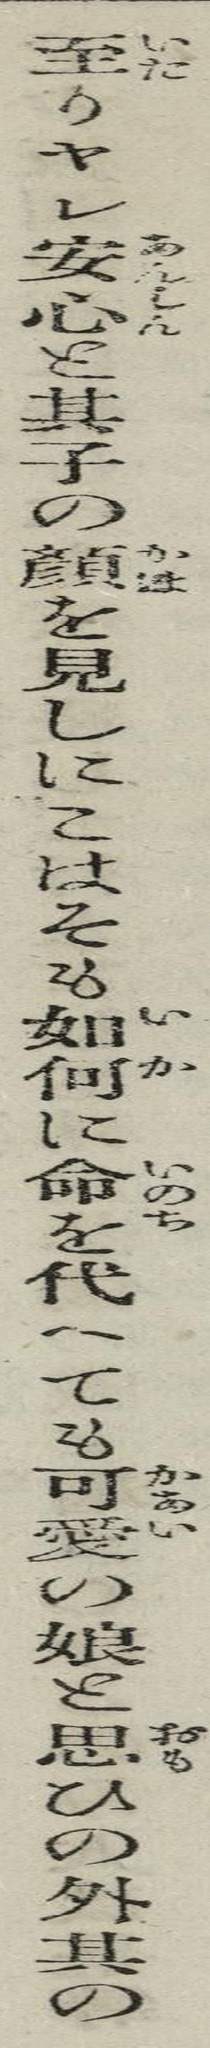至りヤレ安心と其子の顔を見しにこはそも如何に命を代へても可愛の娘と思ひの外其の
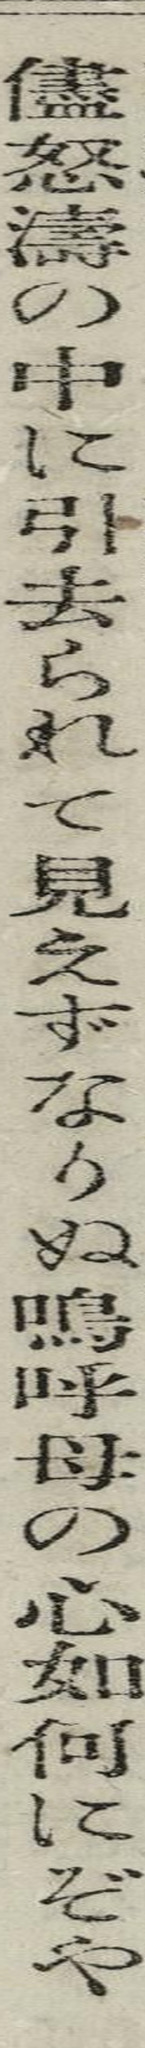夜余所の中に引去られて見えずなりぬ嗚呼母の心如何にぞや
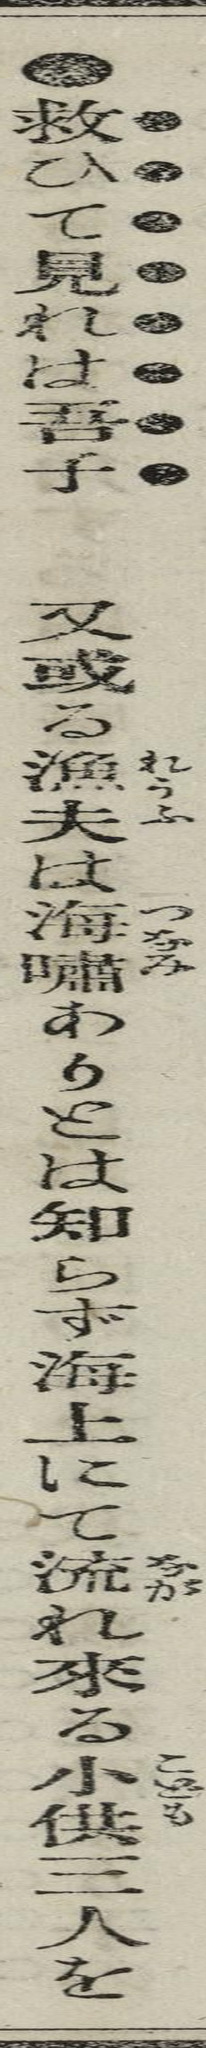●救ひて見れば吾子又或る漁夫は海嘯ありとは知らず海上にて流れ来る子供三人を
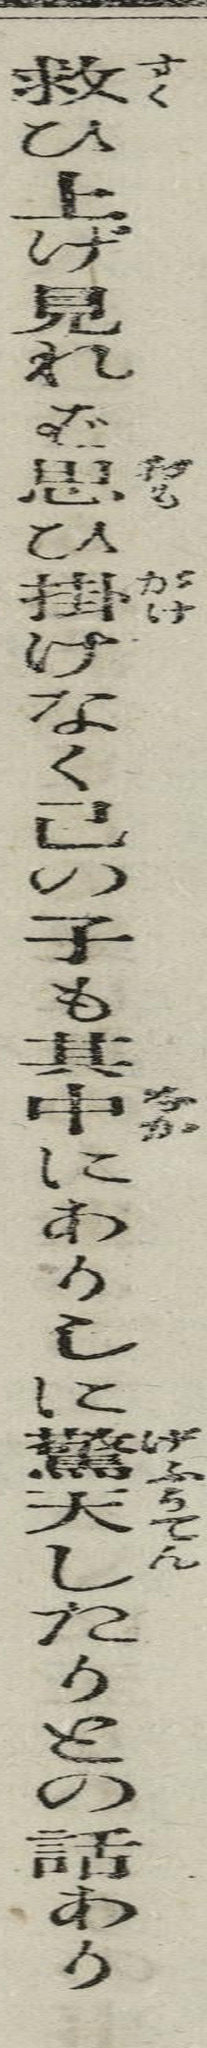救ひ上げ見れば思ひ掛けなく己の子も其中にありしに驚天したりとの話あり
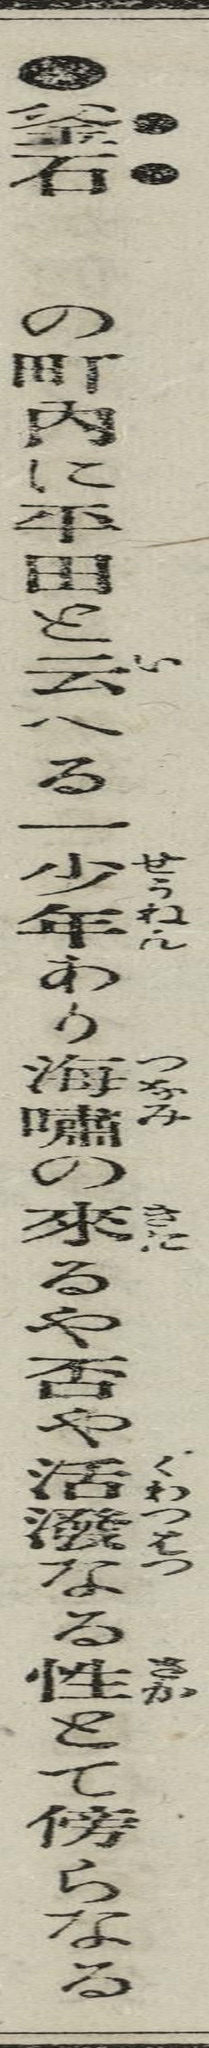●釜石の町内に平田と云へる一少年あり海嘯の来るや否や活発なる性をて傍らなる
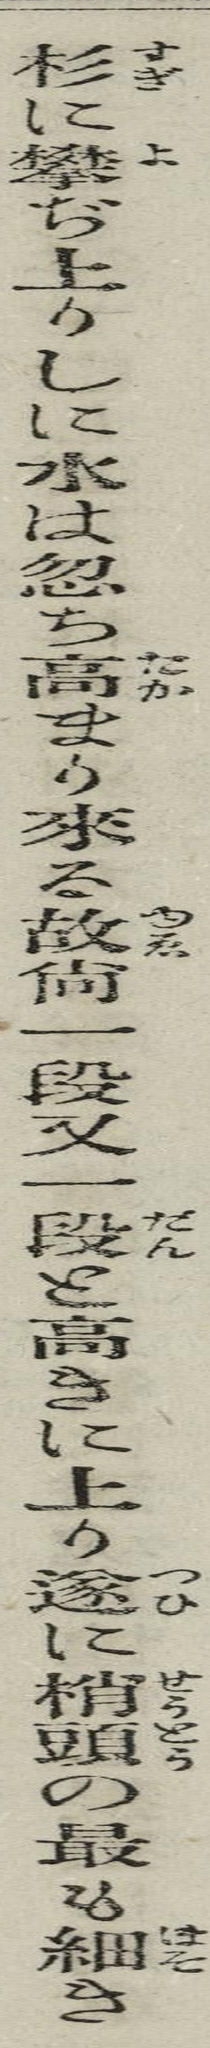杉に攀ぢ上りしに水は忽ち高まり来る故尚一段又一段と高きに上り遂に梢頭の最も細き
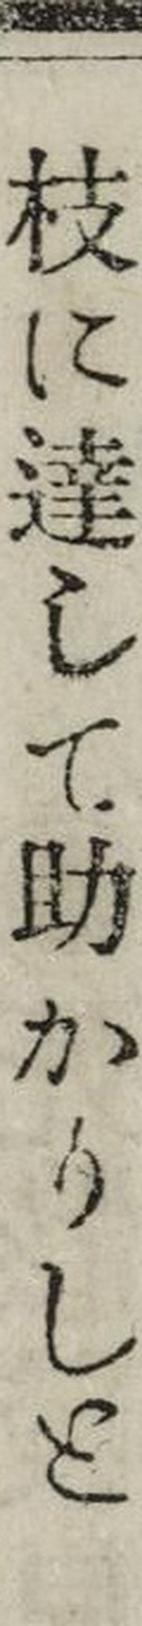枝に達して助かりしと
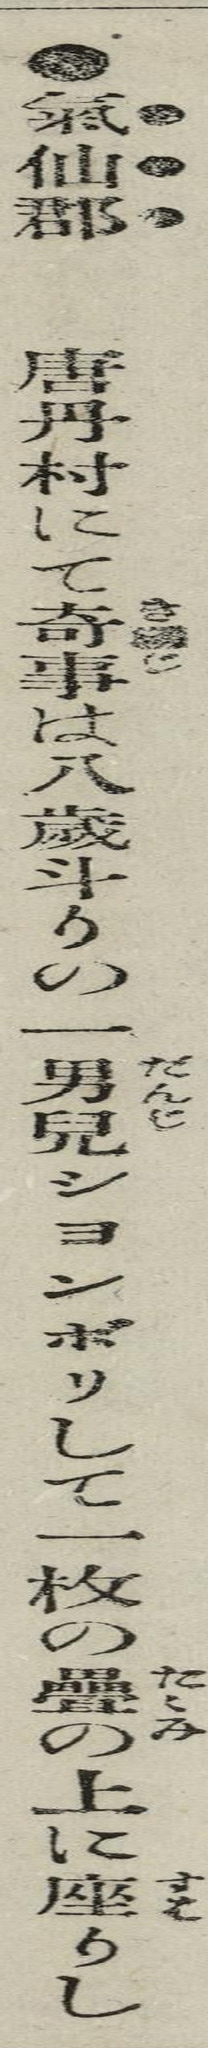●気仙郡唐丹村にて奇事は八歳斗りの一男児ションボリして一枚の畳の上に座りし
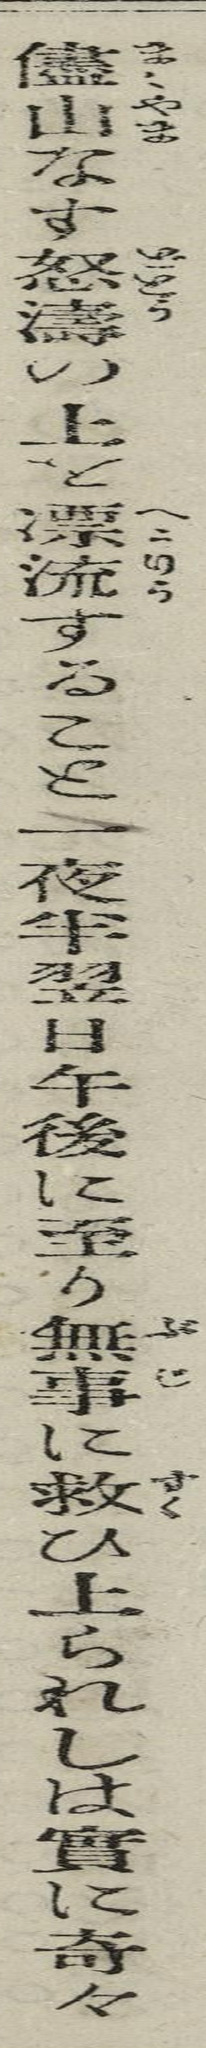儘山なす怒涛の上を漂流すること一夜半翌日午後に至り無事に救ひ上られしは寶に奇々
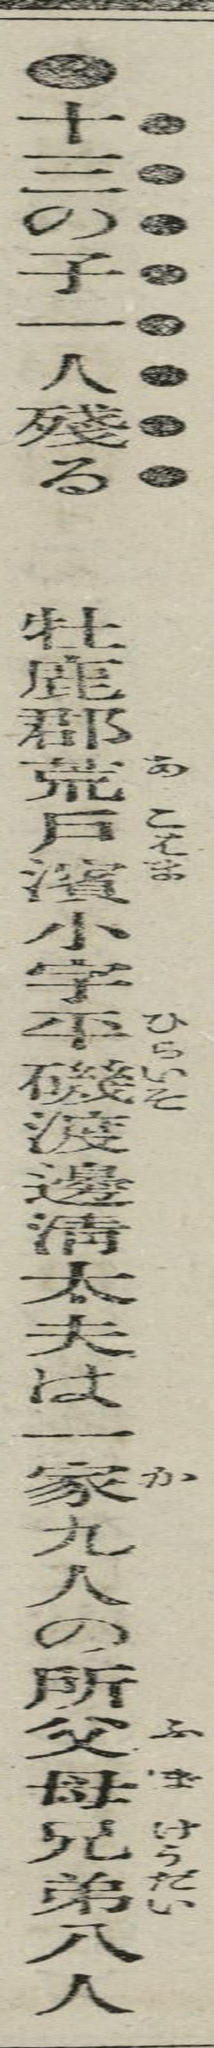●十三の子一人残る牡鹿郡荒戸濱小字平磯渡邊清太夫は一家九人の所父母兄弟八人
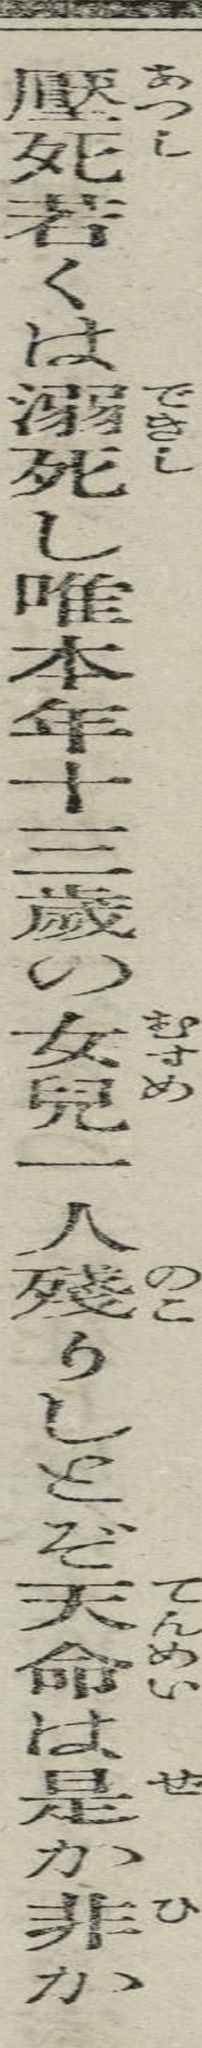圧死若しくは溺死し唯本年十三歳の女児一人残りしとぞ天命は是か非か
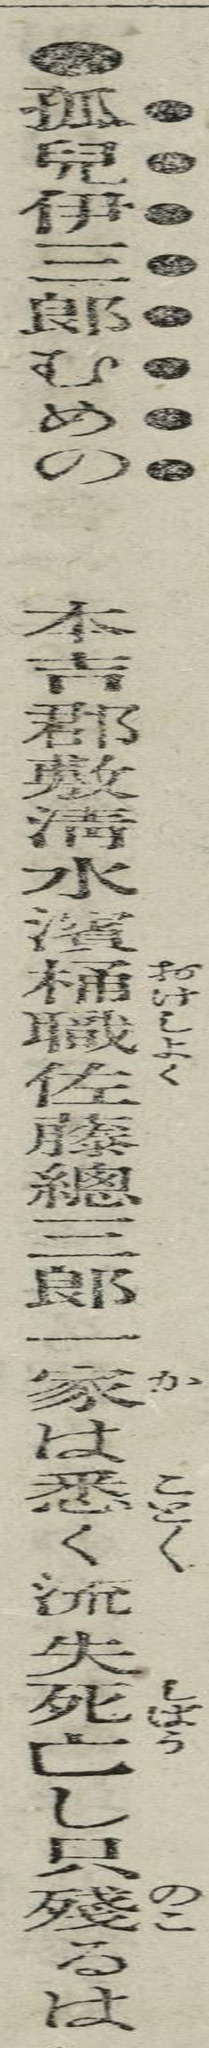●孤児伊三郎むめの本吉郡敷清水濱桶職佐藤總三郎一家は悉く流失死亡し只残るは
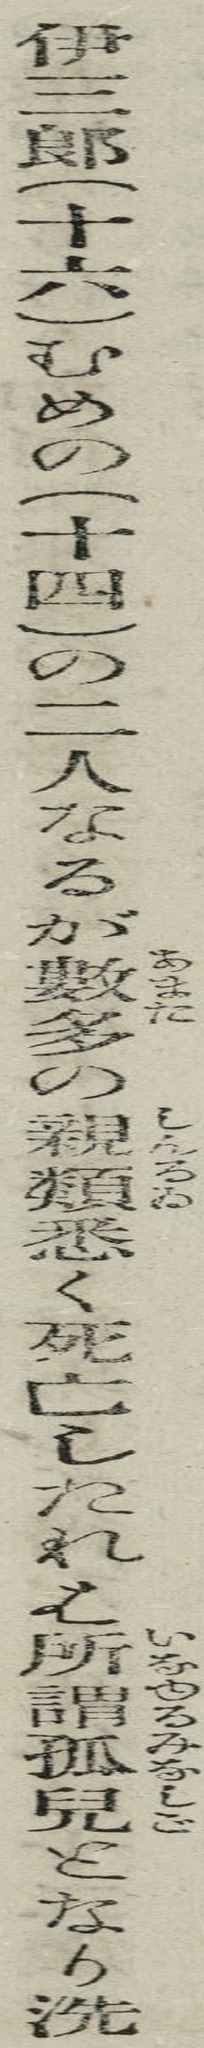伊三郎むめのの二人なるが数多の親類悉く死亡したれは所謂孤児となり洗
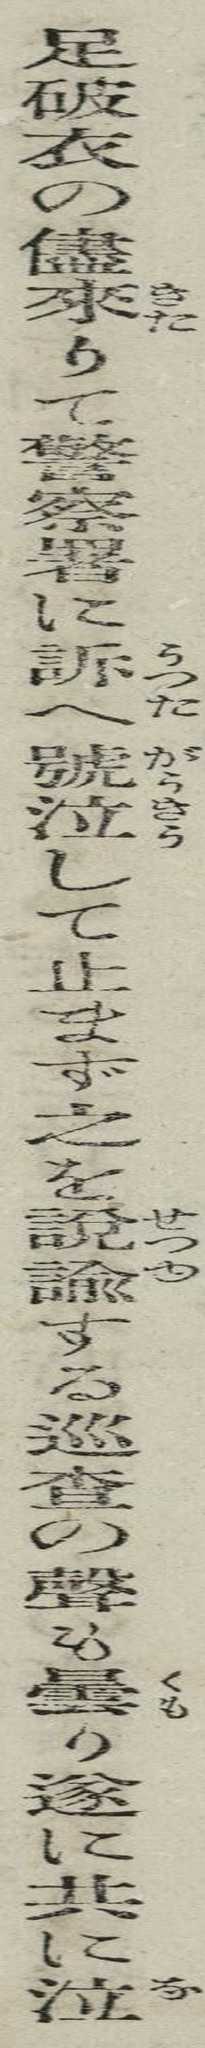足破衣の儘来りて警察署に訴へ号泣して止まず之を説諭する巡査の聲も曇り遂に共に泣
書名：三陸海嘯細見
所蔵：東京大学地震研究所図書室 Earthquake Research Institute Library, The University of Tokyo, JAPAN
